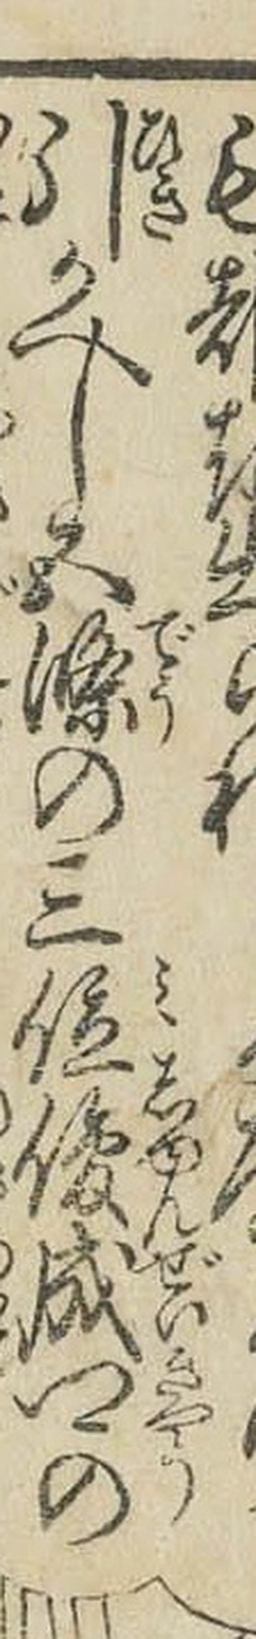引かへし五條の三位俊成卿の
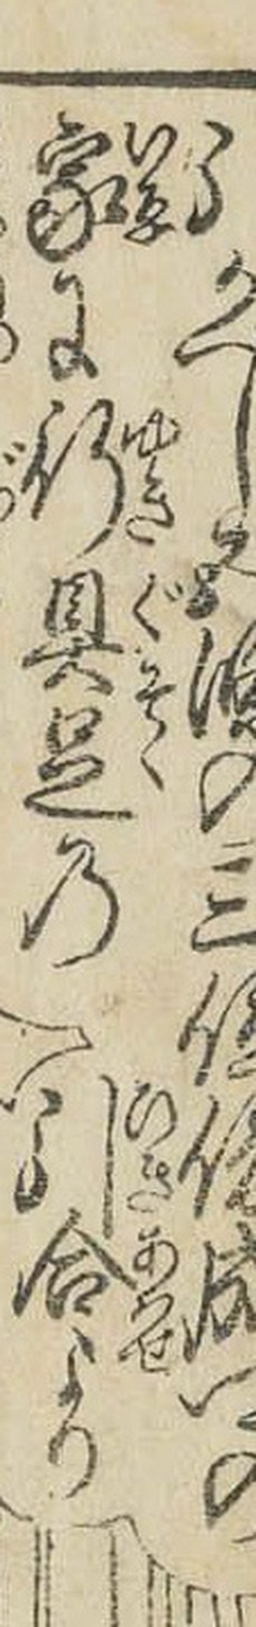家に行具足の引合より
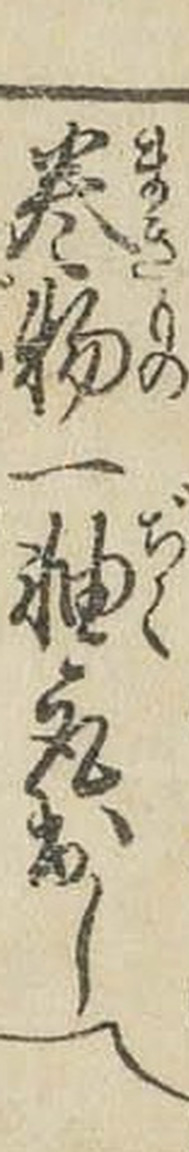巻物一軸取出し
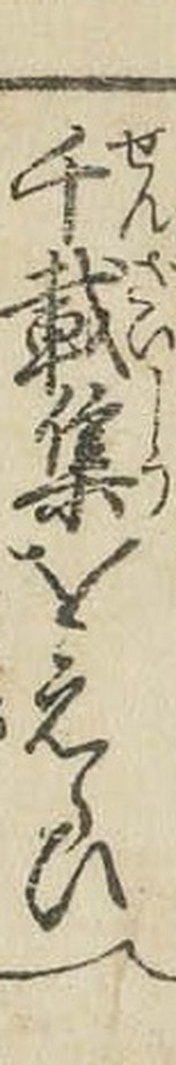千載集をえらひ
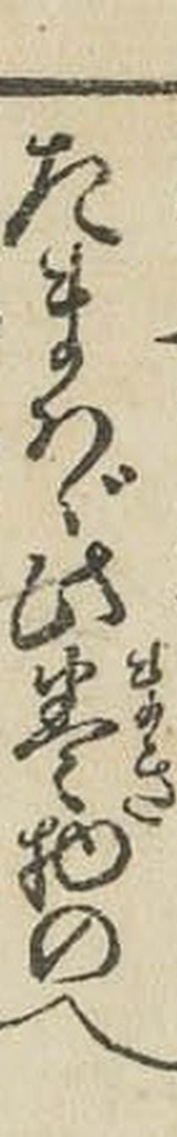たまはゞ此巻物の
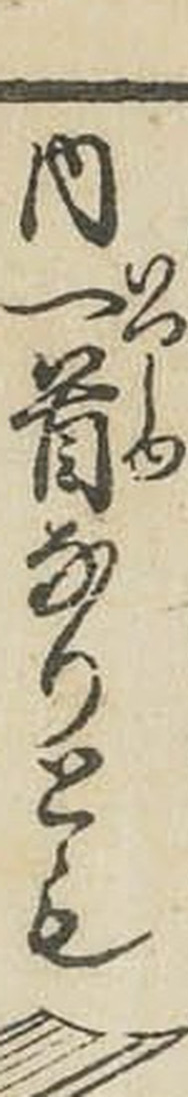内一首なりとも
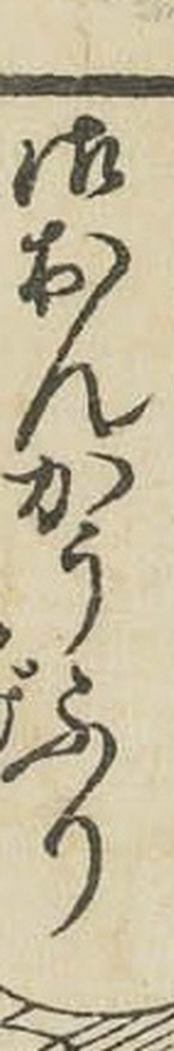御おんかうふり
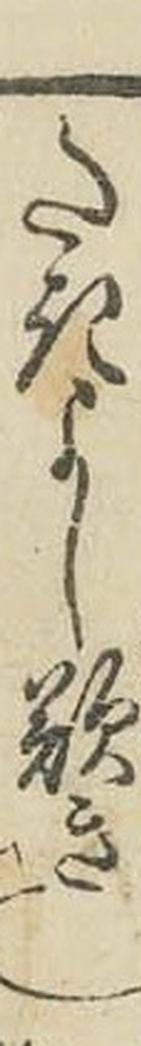たきよし歎き
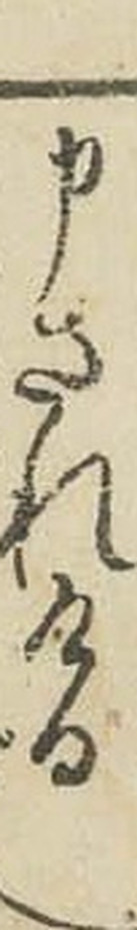申されける
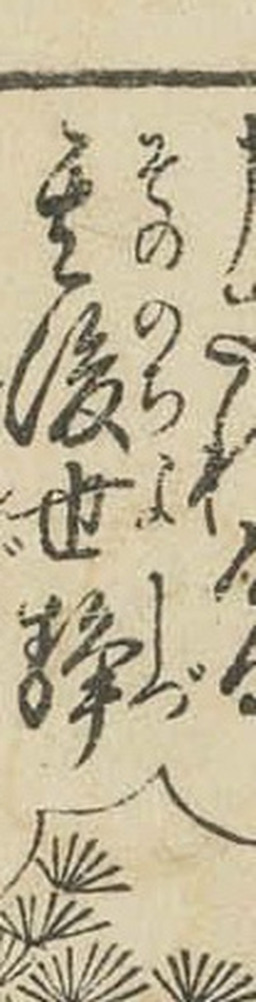其後世静
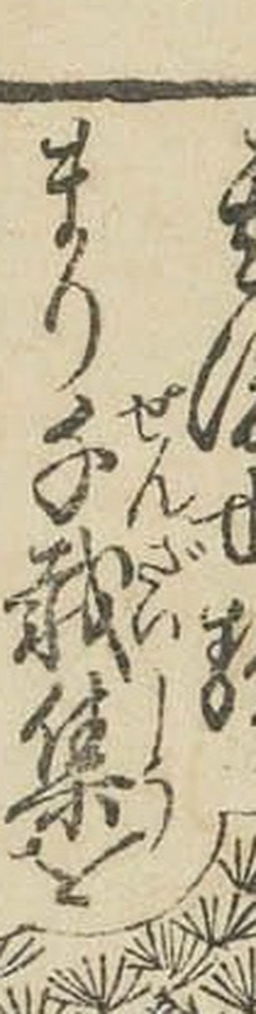まり千載集を
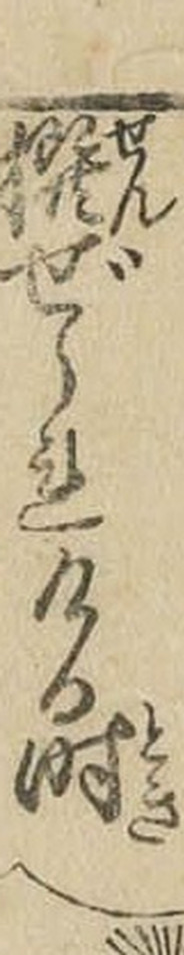撰ぜられける時
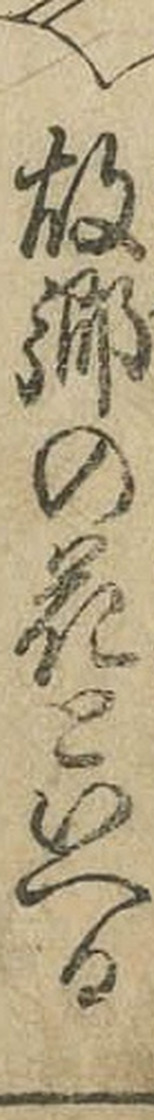故郷の花といへる
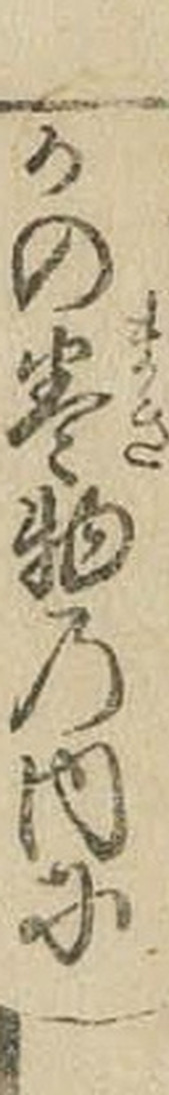かの巻物の内に
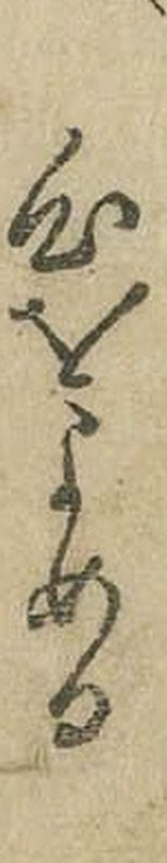心をよめる
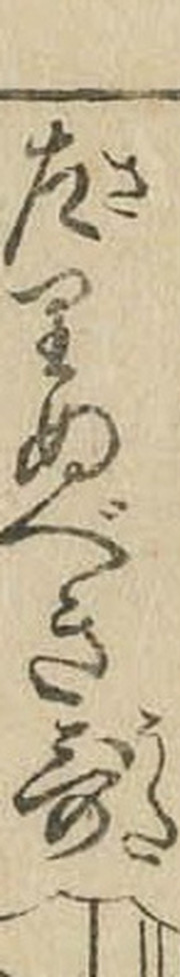左りぬべき哥
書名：絵本写宝袋 9巻 1之巻
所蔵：東京学芸大学教育コンテンツアーカイブ
